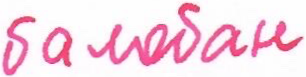балобан
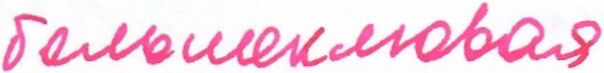большеклювая
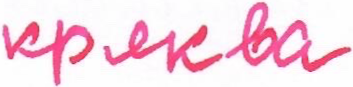кряква
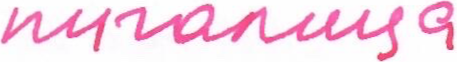пигалица
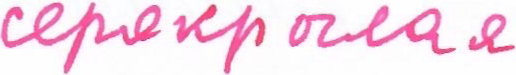серокрылая
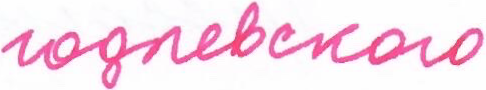годлевского
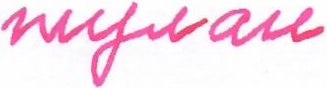жулан
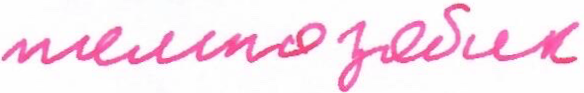желтозябик
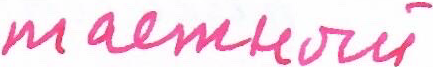таежный
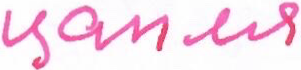цапля
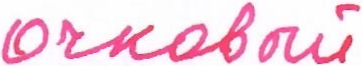очковый
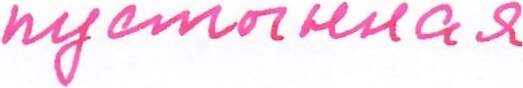пустынная
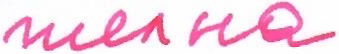желна
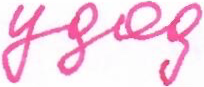удод
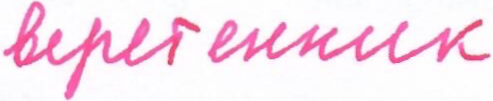веретенник
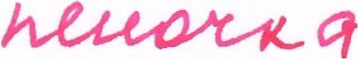пеночка
